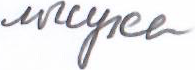лысуха
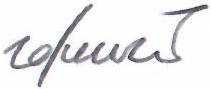горный
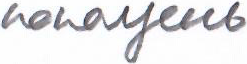поползень
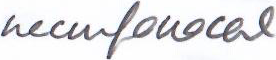пестроносая
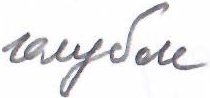голубок
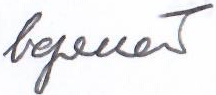водяной
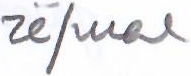чёрная
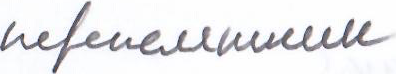перепелятник
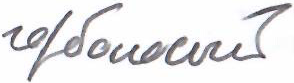горбоносый
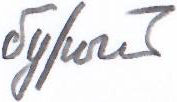бурый
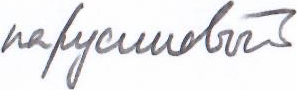парусиновый
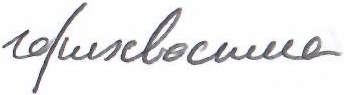горихвостка
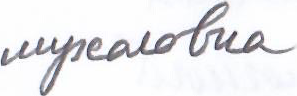мухоловка
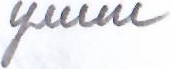улит
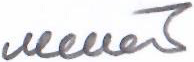лесной
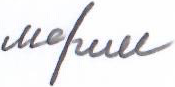люрик
